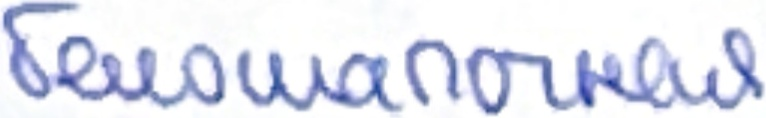белошапочная
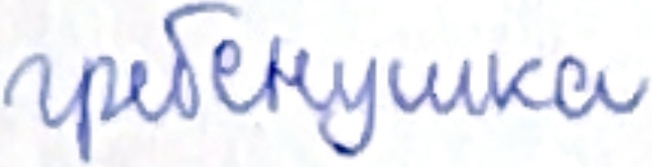гребенушка
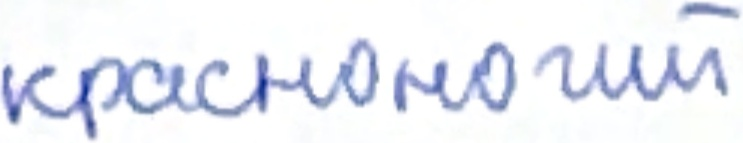красноногий
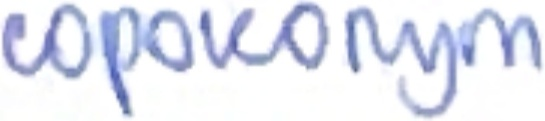сорокопут
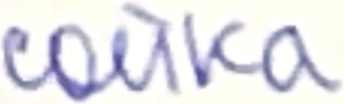сойка
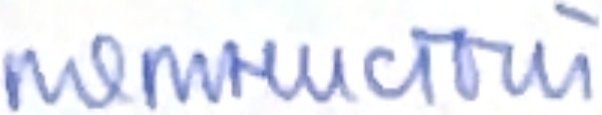пятнистый
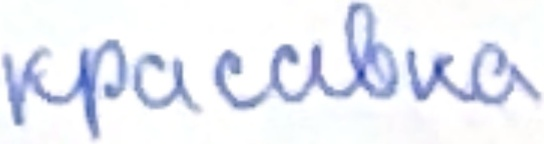красавка
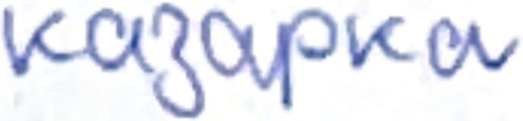казарка
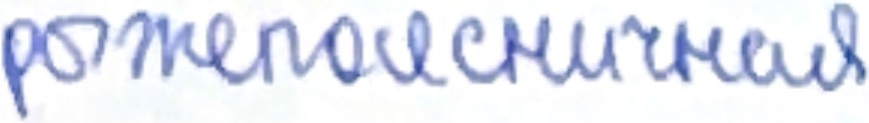рыжепоясничная
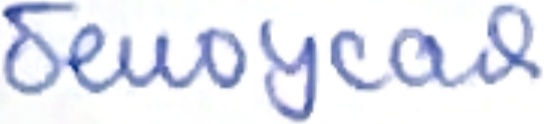белоусая
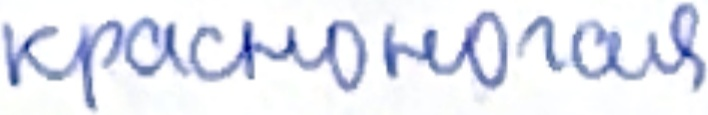красноногая
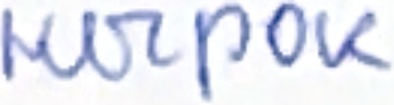нырок
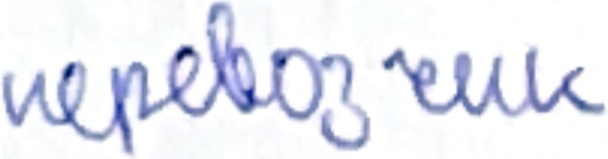перевозчик
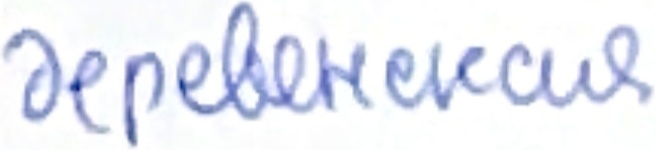деревенская
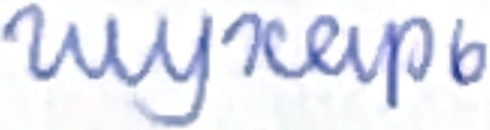глухарь
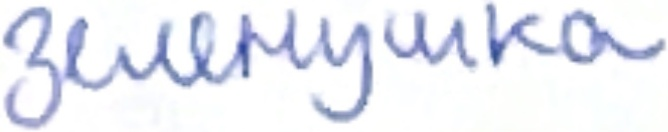зеленушка
